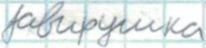завирушка
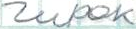чирок
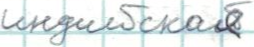индийская
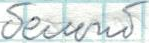белый
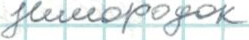зимородок
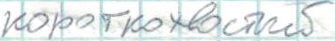короткохвостый
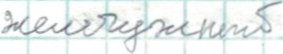жемчужный
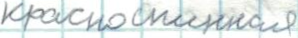красноспинная
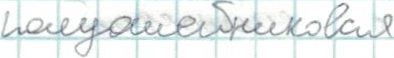полуошейниковая
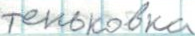теньковка
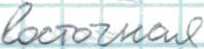восточная
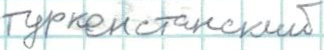туркенстанский
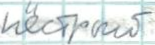пёстрый
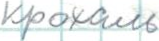крохаль
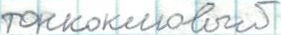тонкоклювый
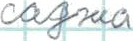саджа
